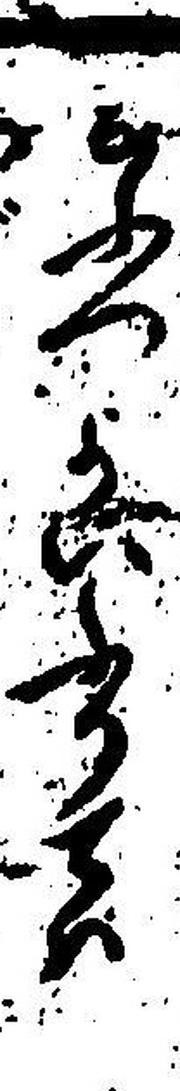こふつかいふりては
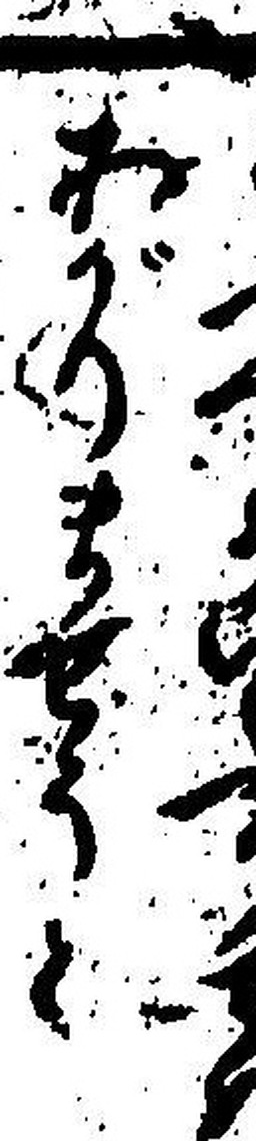あがりませうと
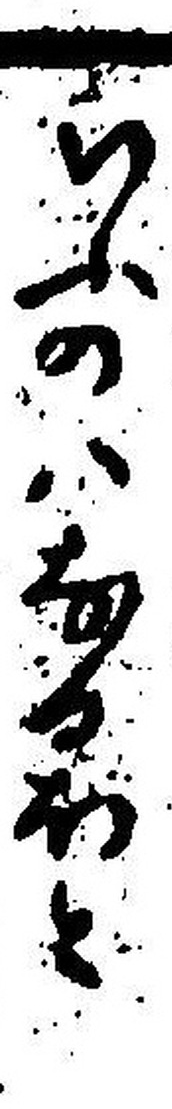いふのはなるほと
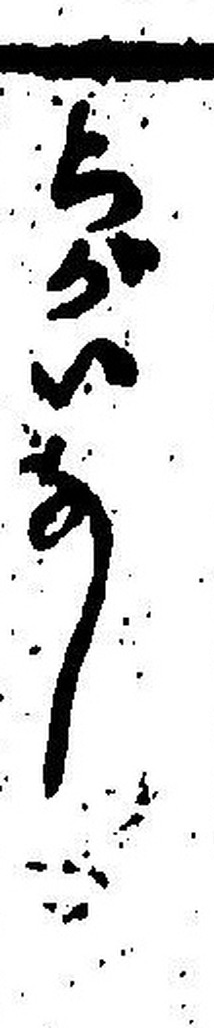ちがいなし
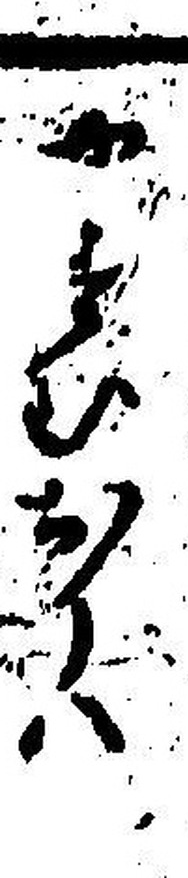やすむおりは
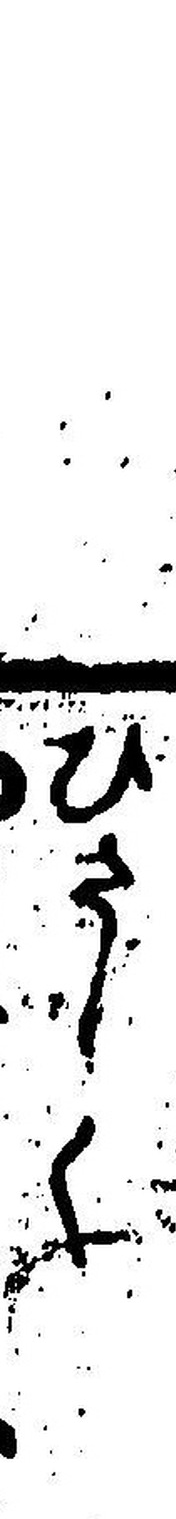ひさしく
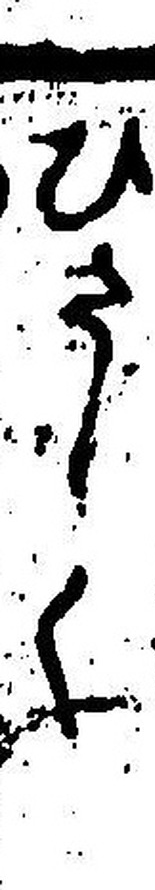ひさしく
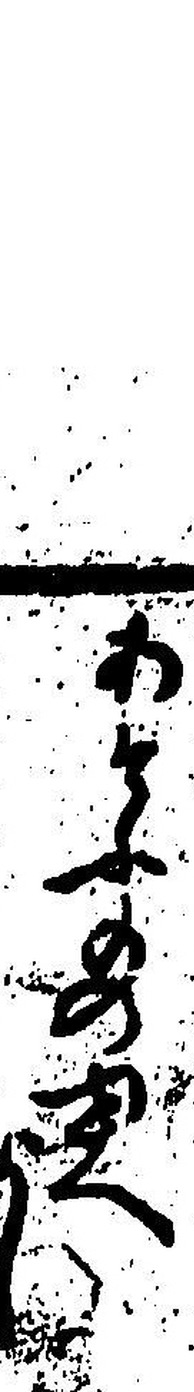あそふものゆへ
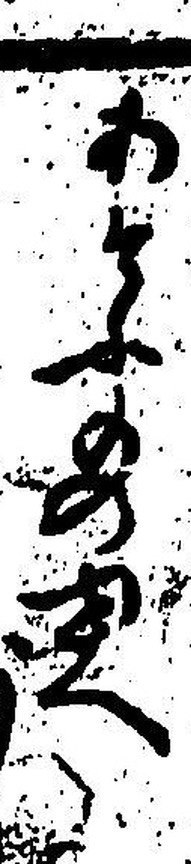あそふものゆへ
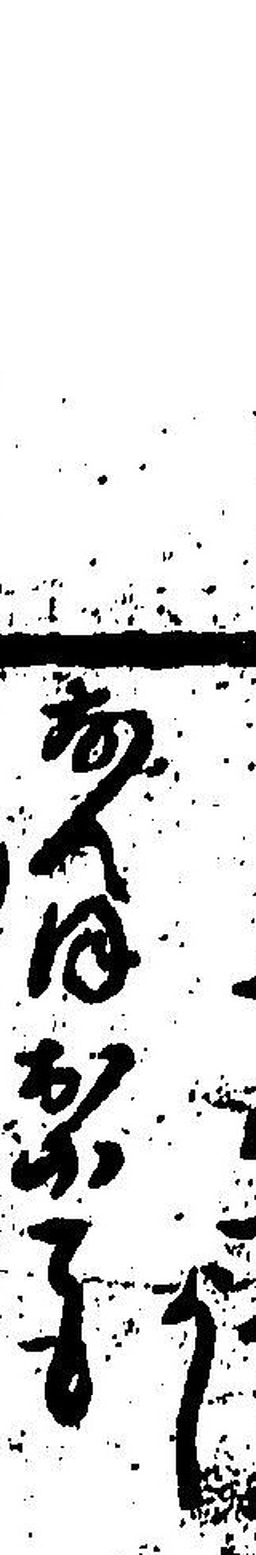なんほおふても
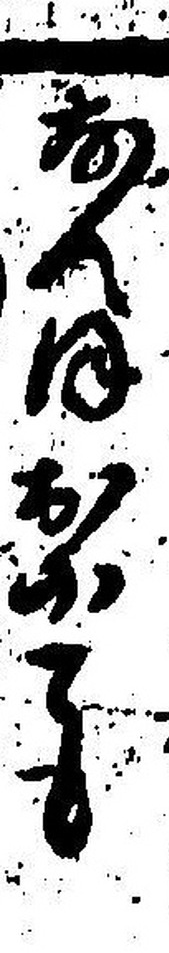なんほおふても
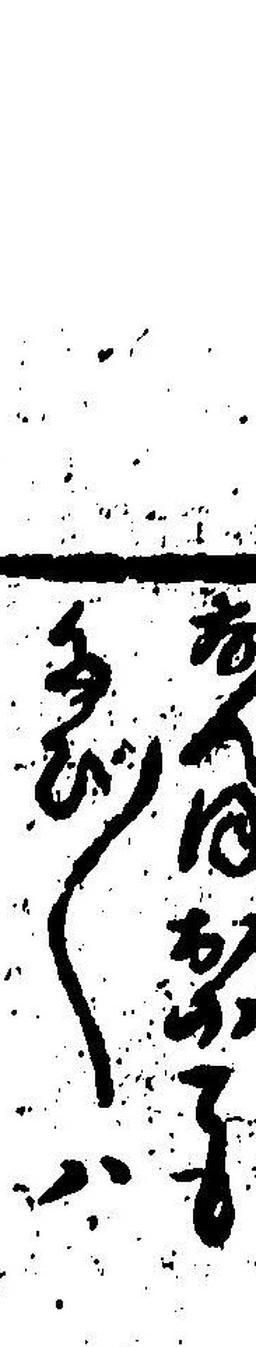たび〳〵は
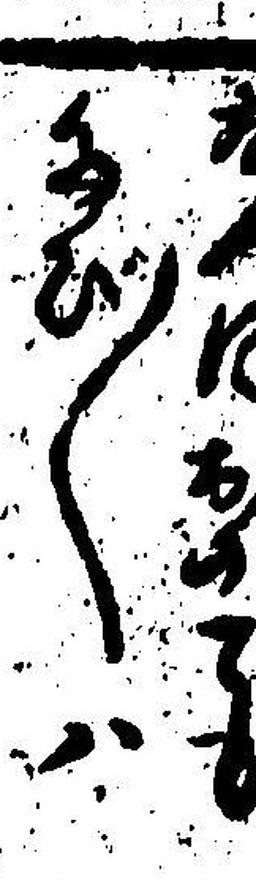たび〳〵は

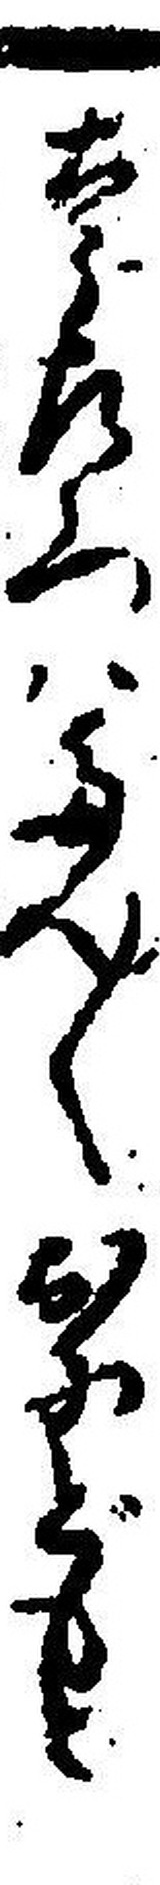太郎左衛門はたん〳〵おにどもと
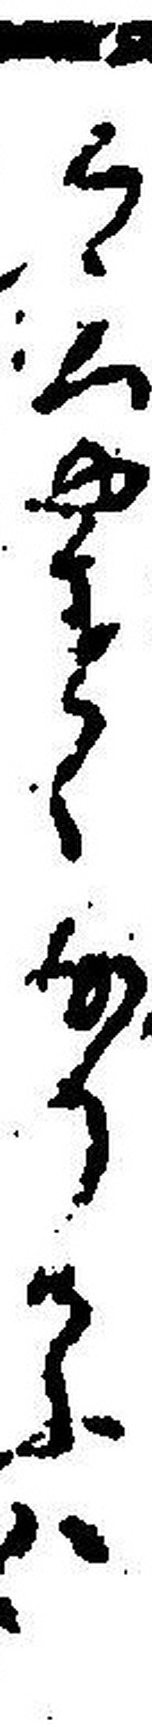こゝろやすくなりけふは
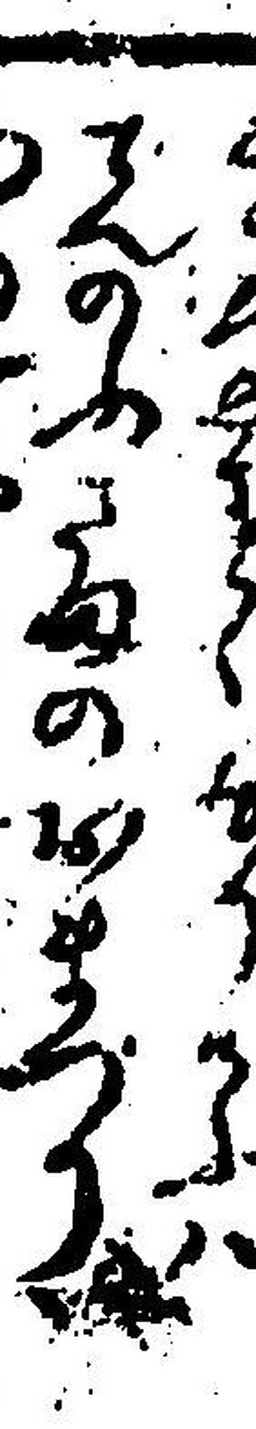てんのふさまのおまつり
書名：牡丹餅棚有 / 市場通笑作
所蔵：東京大学総合図書館 General Library in the University of Tokyo, JAPAN
